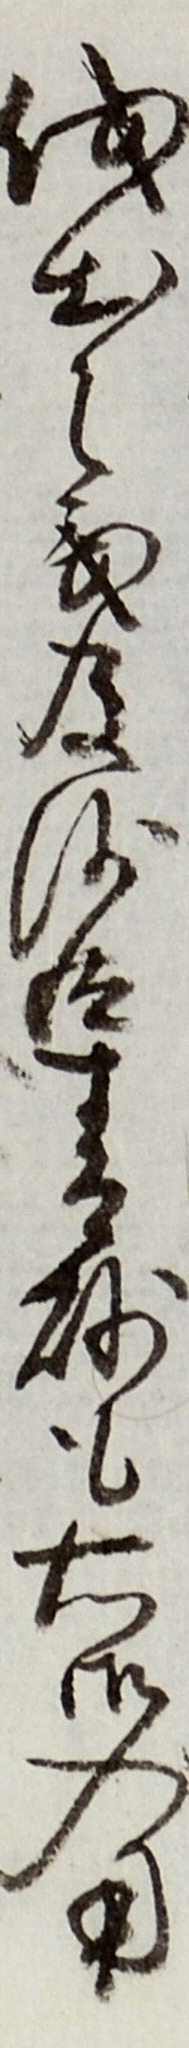伐出之義及沙汰青砂も右御入用
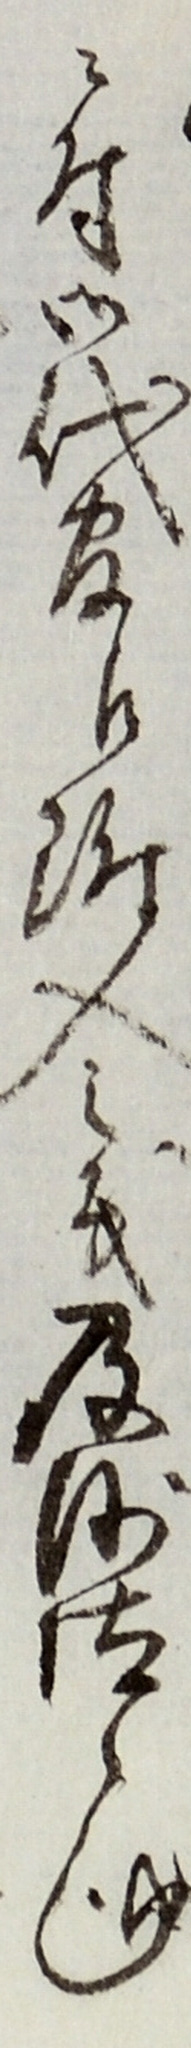ニ付御代官江付入之義及沙汰候趣
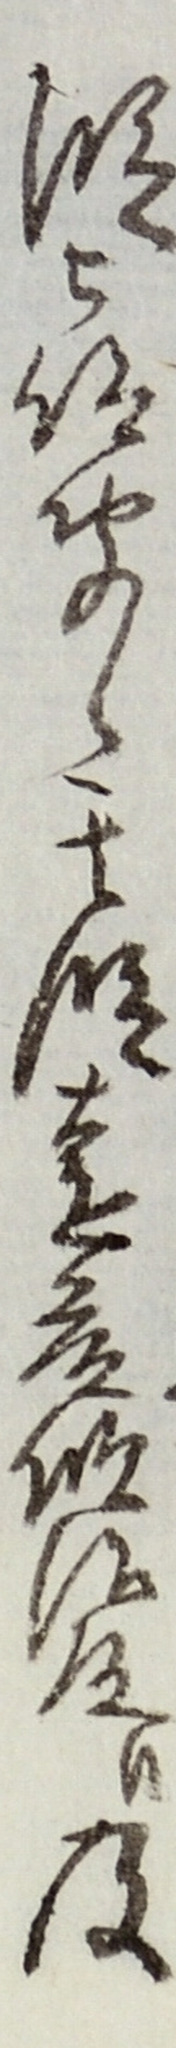段被仰聞候其段遠藤欣治殿江及
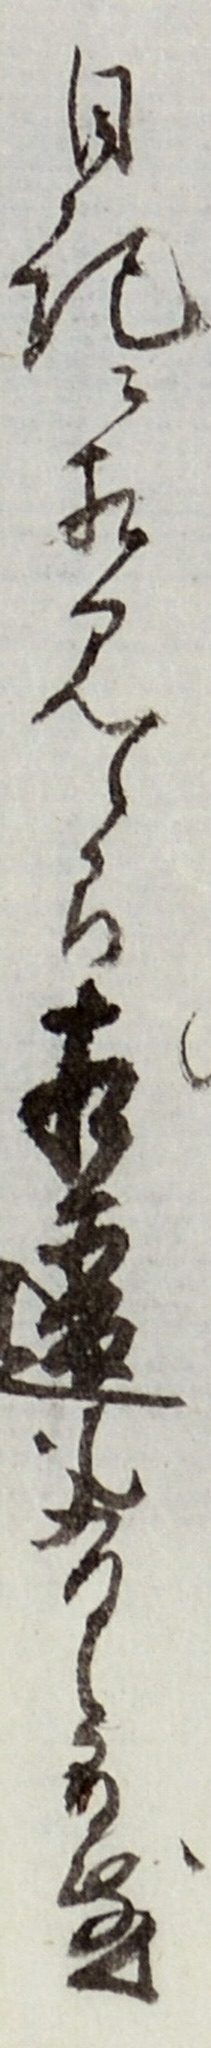日記ニ相見候間相違も有之間敷
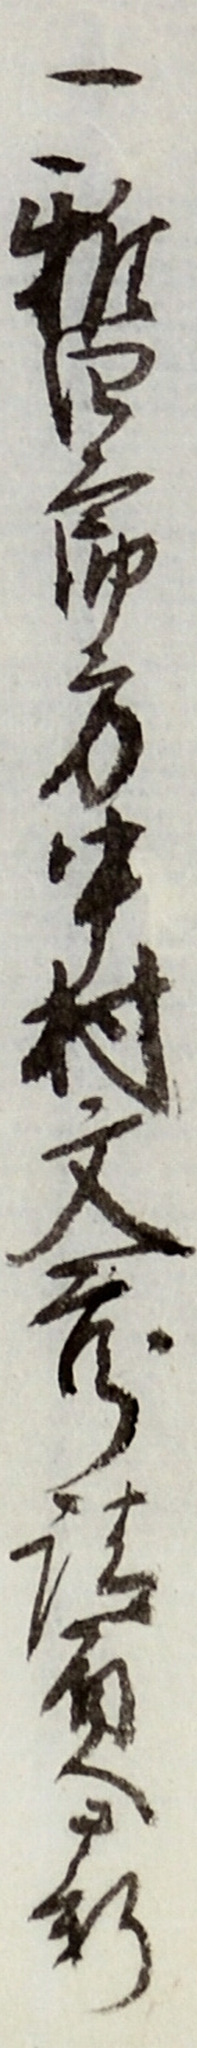一雅四郎方中村文蔵請負薪
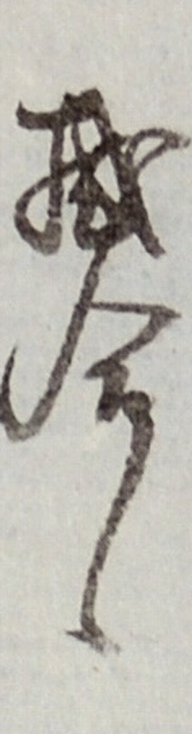掛合候
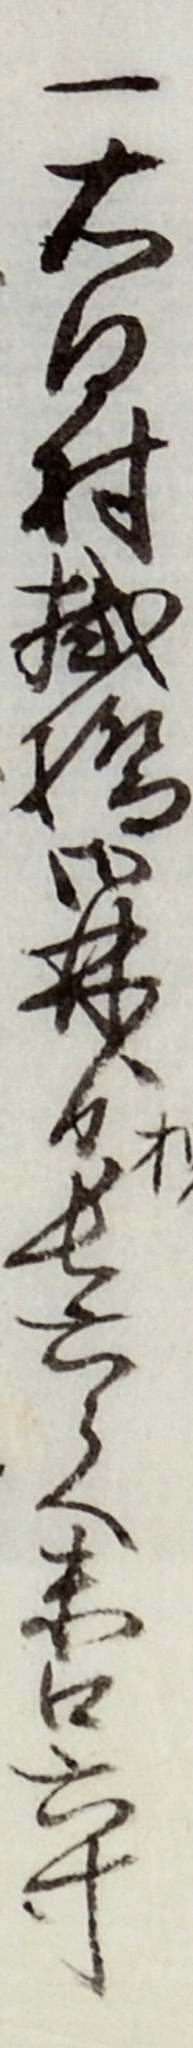一右同村掛橋御林ゟ槐長六尺末口六寸
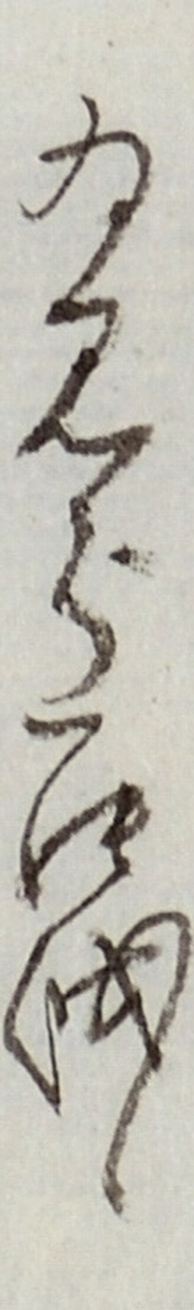為見分罷越候
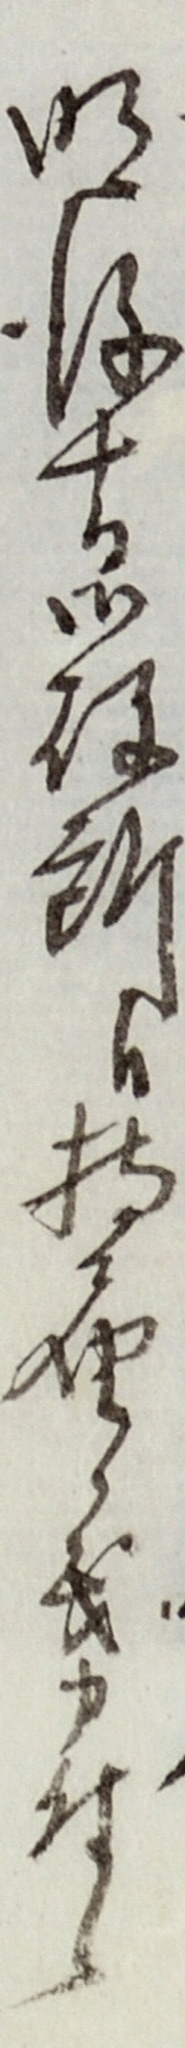明後十日御役所江持届候義申付候
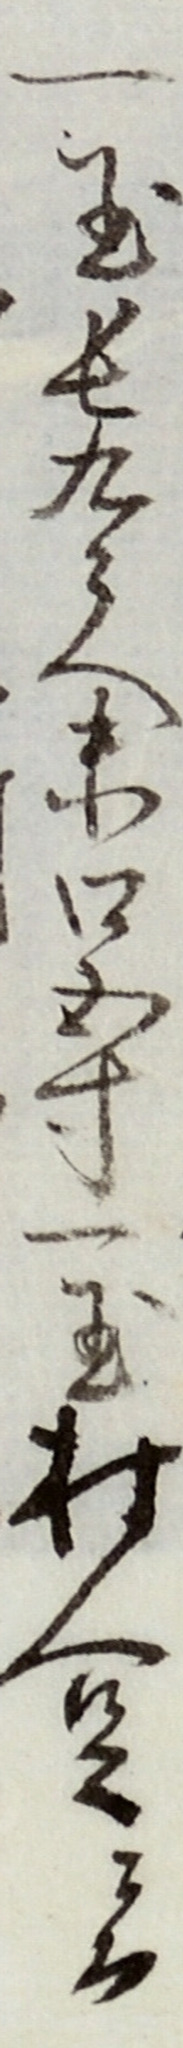一玉長九尺末口五寸一玉村人足ニ而
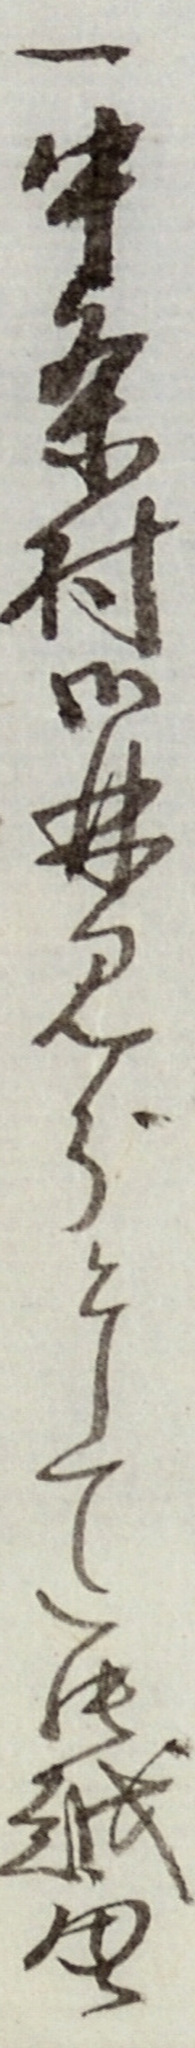一中条村御林見分として罷越唐
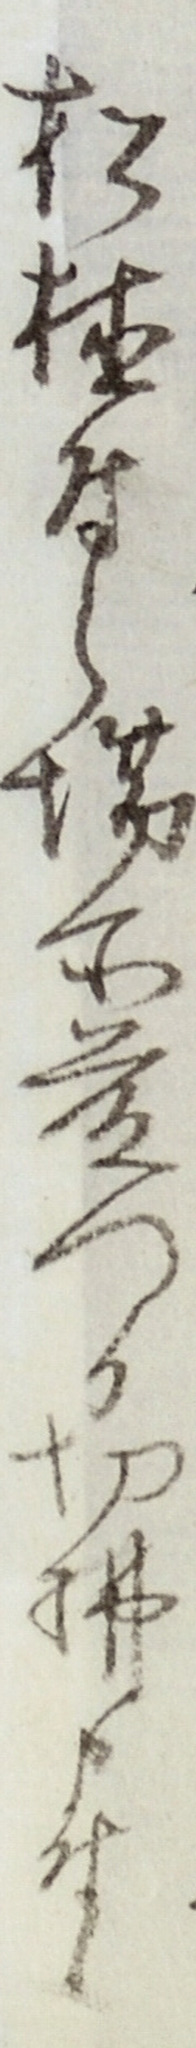松植付候場所藤つる切払申付候
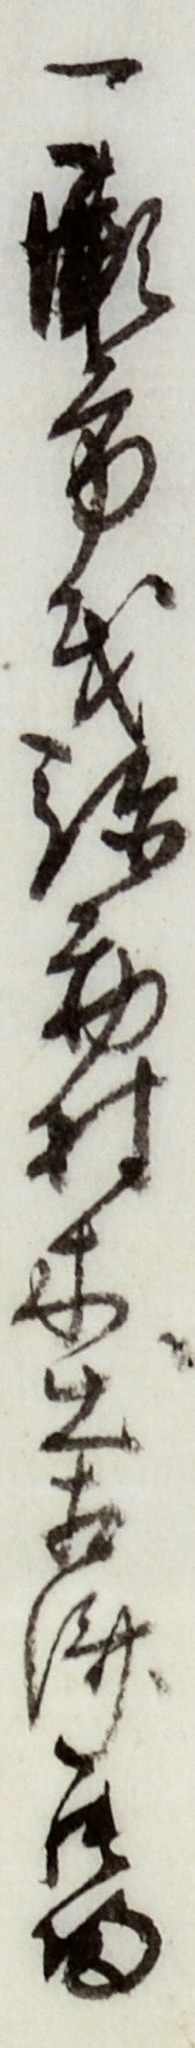一瀬市義弥勒村木出相済罷帰
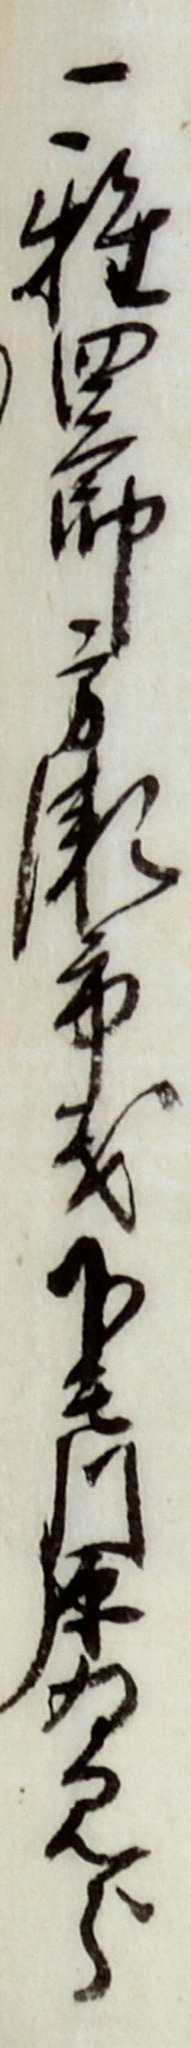一雅四郎方瀬市義下モ川原為見分

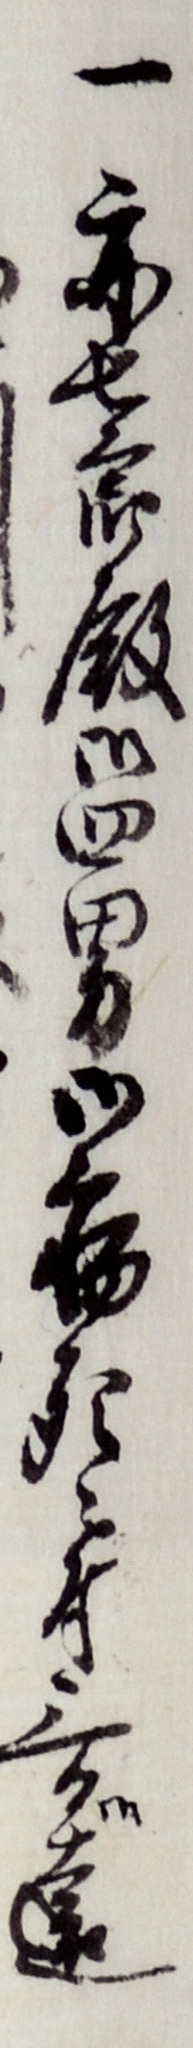一亦七郎殿四男御病死ニ付三日御遠
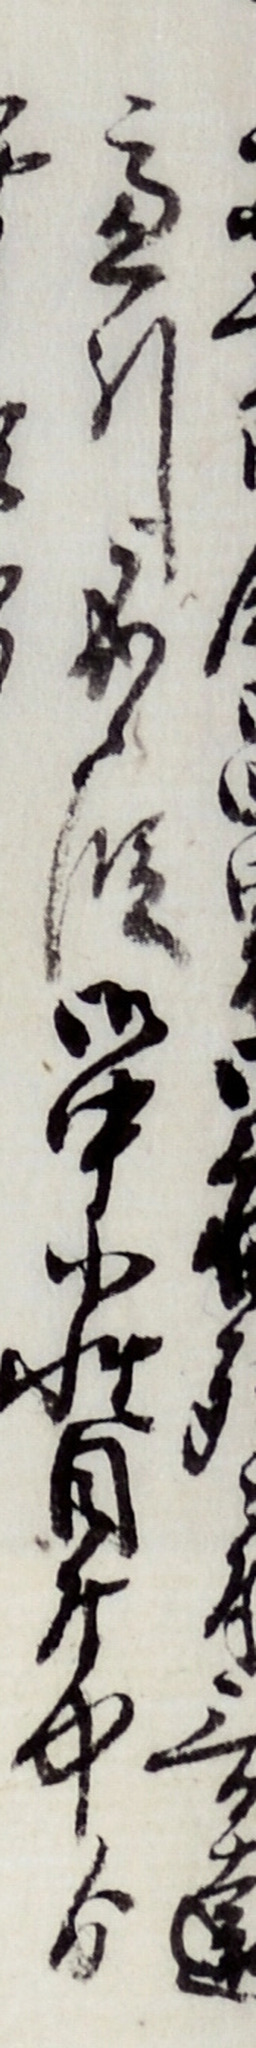慮引被成候段御中小性目付中ゟ
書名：御山方御薪方諸事御用留
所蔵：伊那市立高遠町図書館・合同会社AMANE
